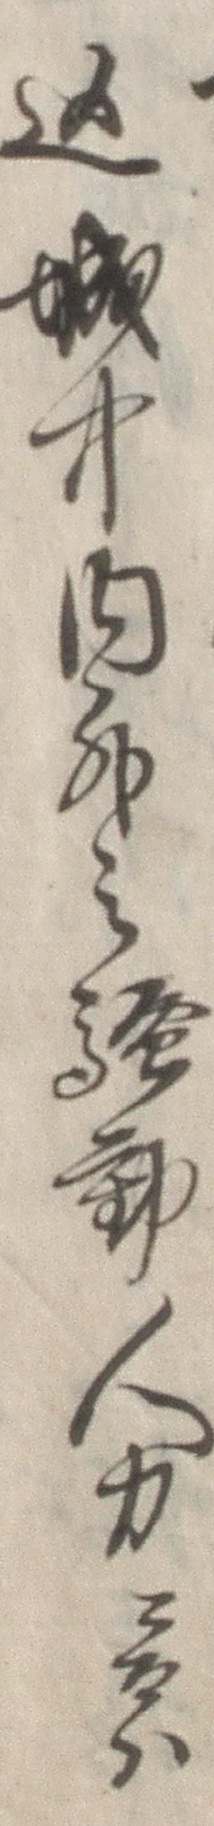込城中内外之騒動人力二而ハ
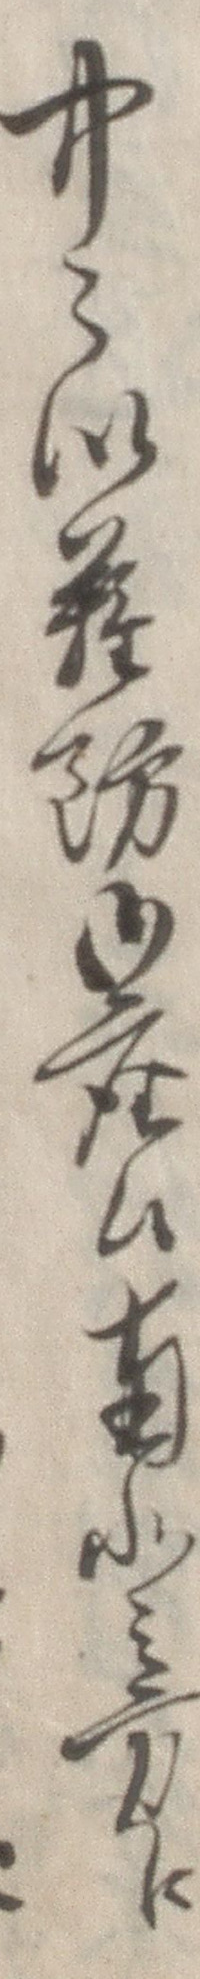中々以難防御座候南北之方江
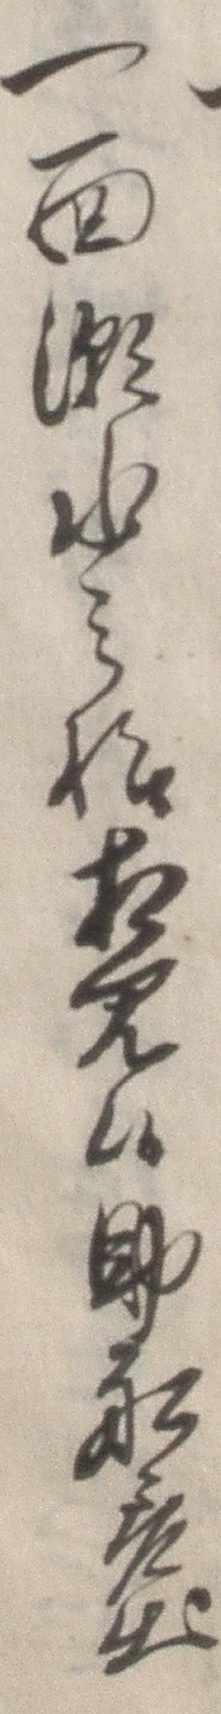一面激水之様相見候助船差出
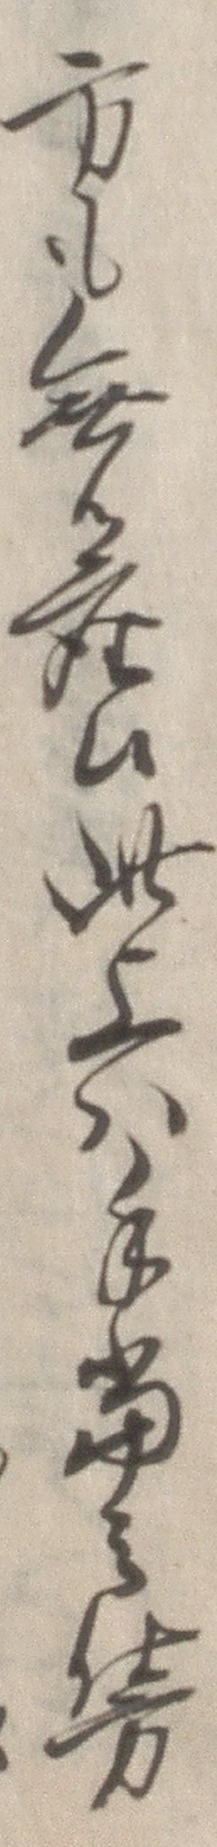方も無御座候此上ハ手当之仕方
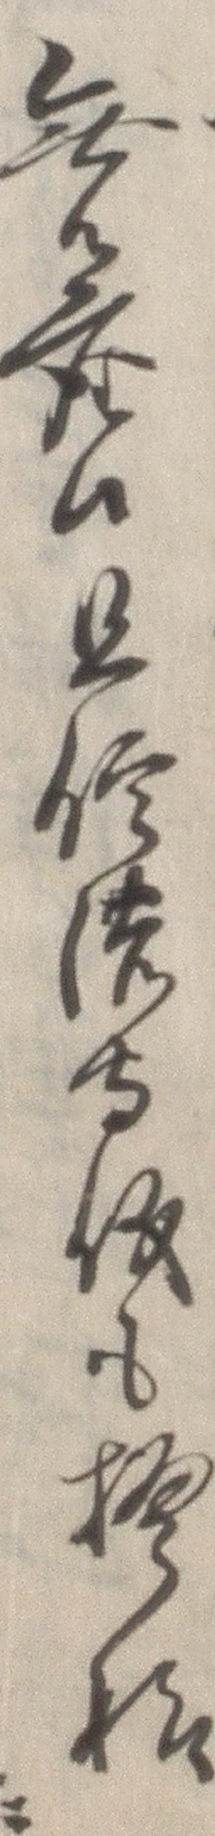無御座候且信濃守儀も拘様
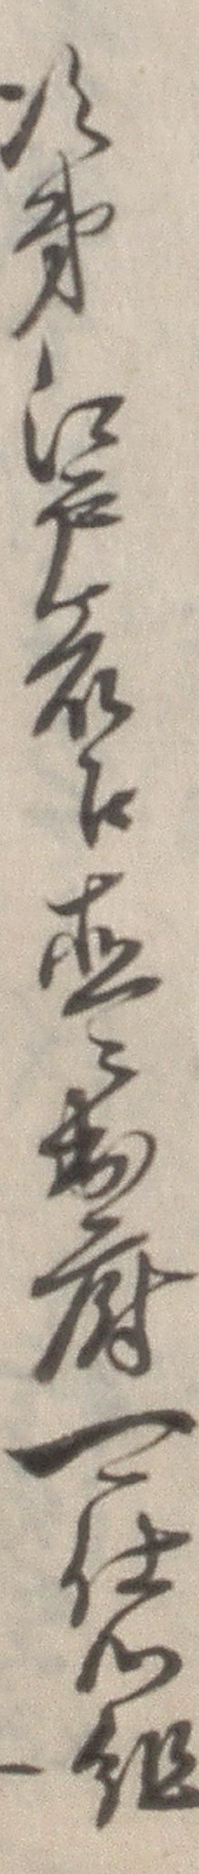次第江戸表江直二出府可仕心組二
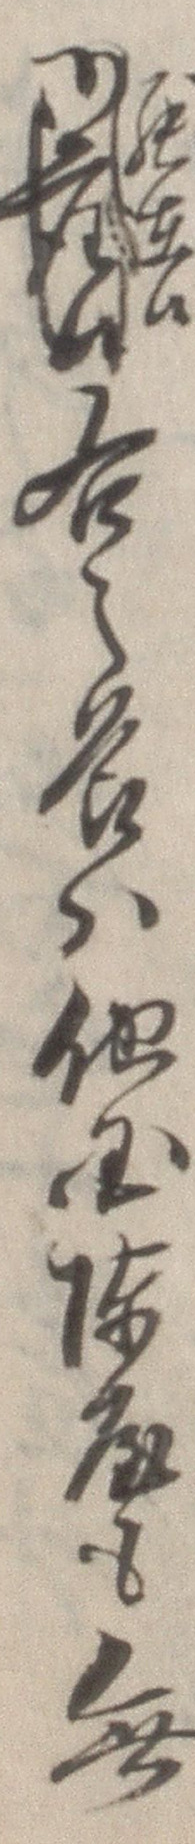御座候右之節ハ他国陣屋も無
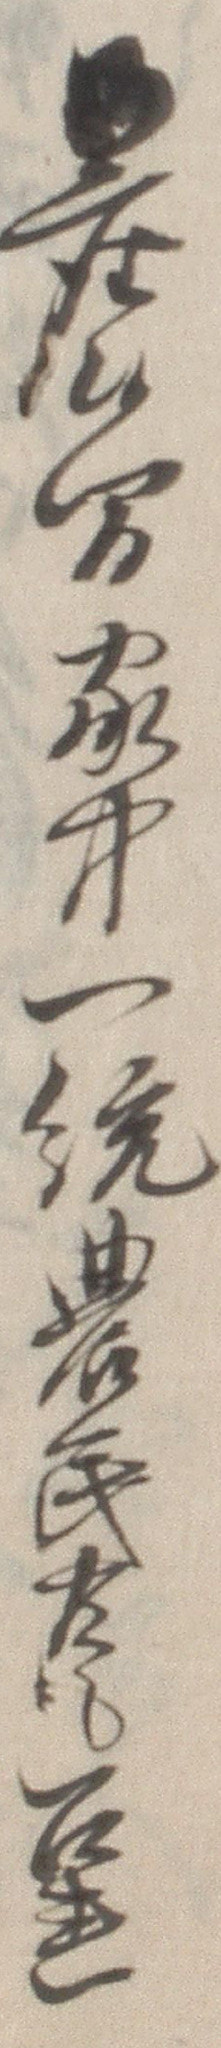御座候間家中一統農民共も召連
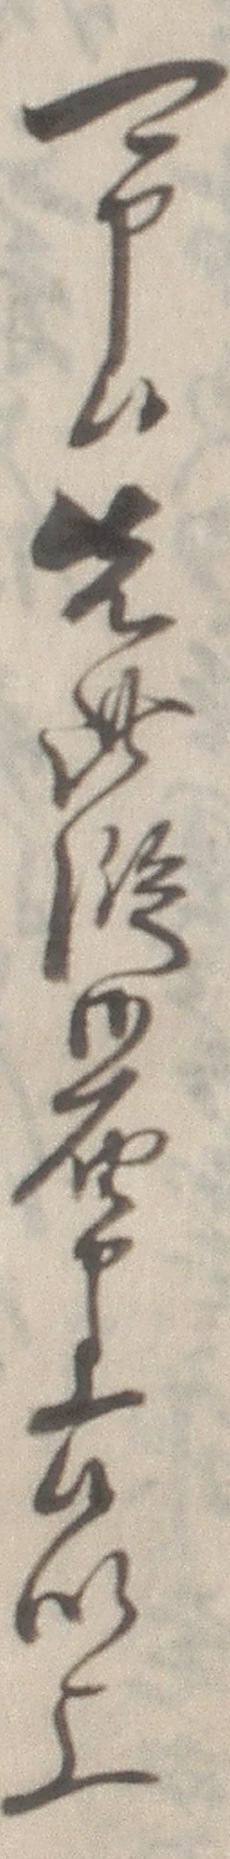可申候先此段御届申上候以上
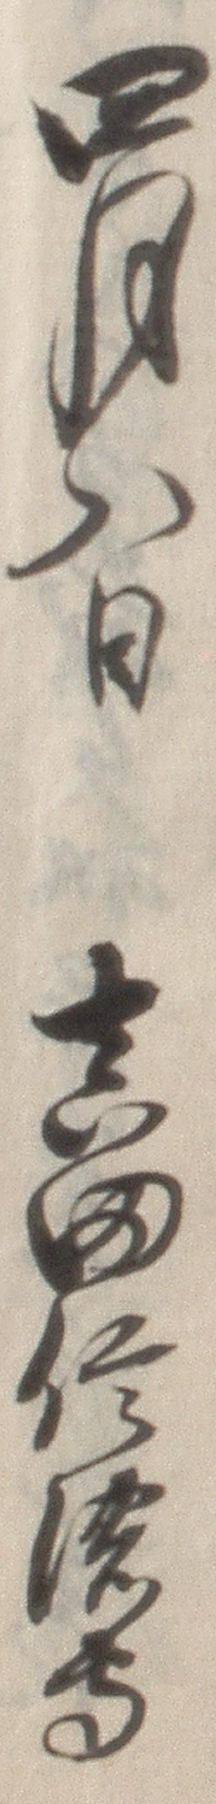四月八日真田信濃守
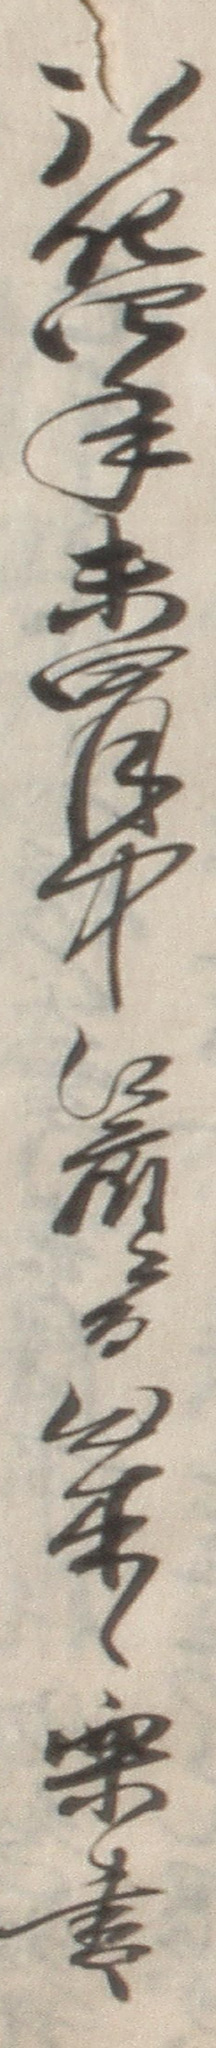弘化四年未四月中江府二而出来候案書
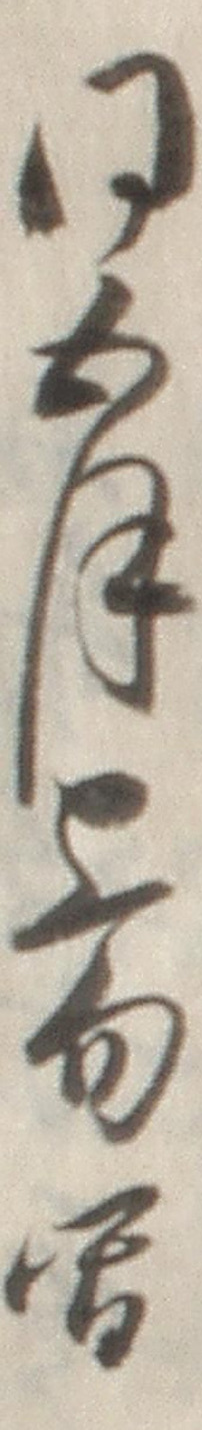同五月上旬写
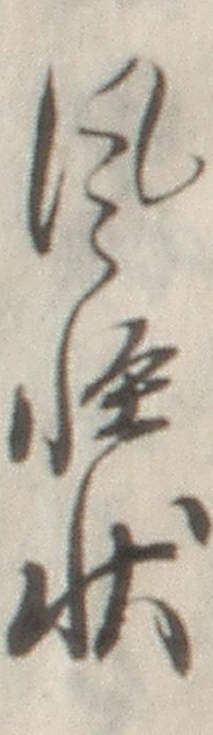風怪状
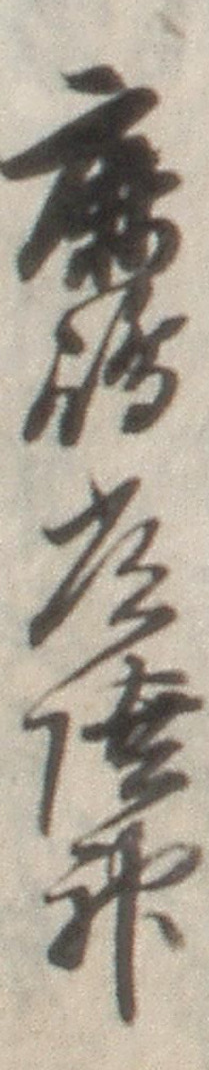廉嶋常陸神
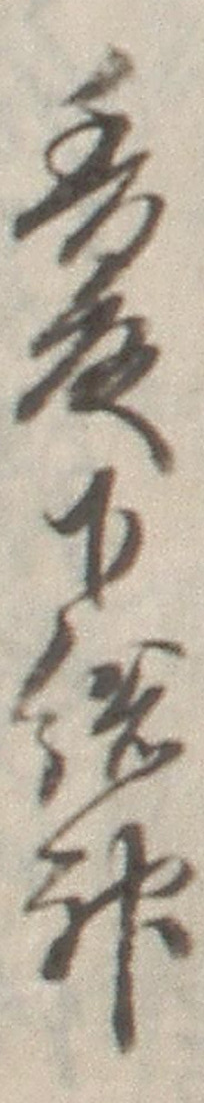兵藤下総神

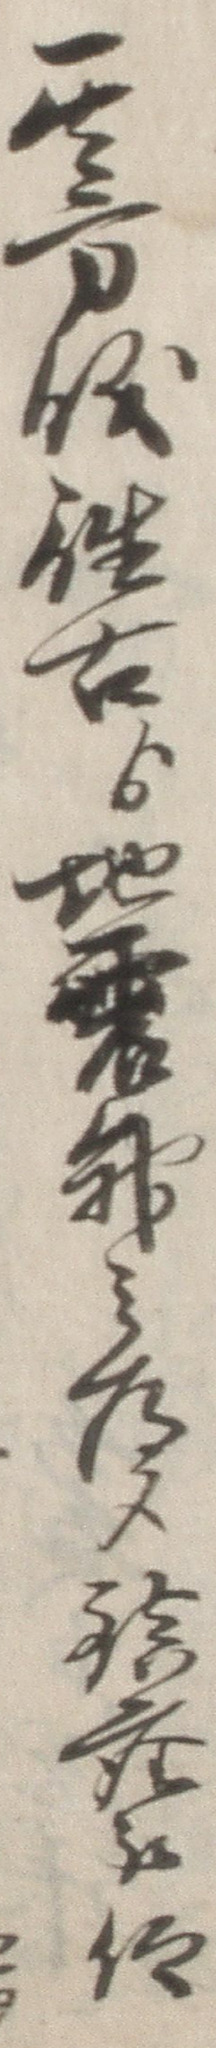其方儀往古ゟ地震神之為メ鎮座仰
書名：信州地震一件
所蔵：東京大学地震研究所図書室 Earthquake Research Institute Library, The University of Tokyo, JAPAN
